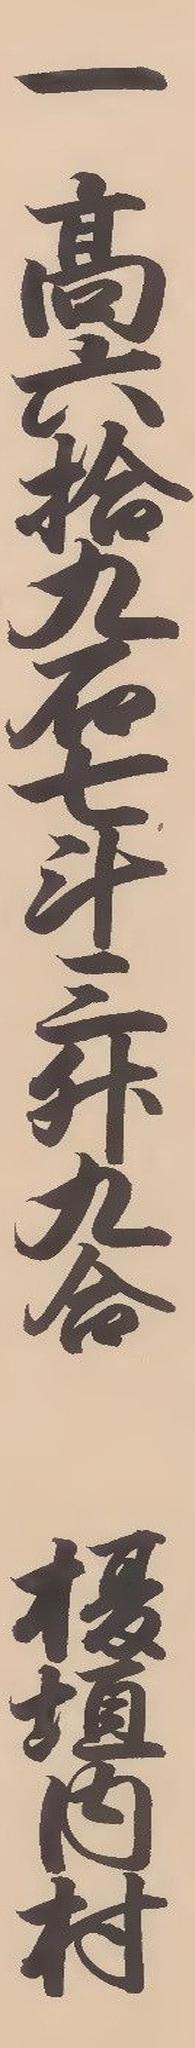一高六拾九石七斗三升九合榎垣内村
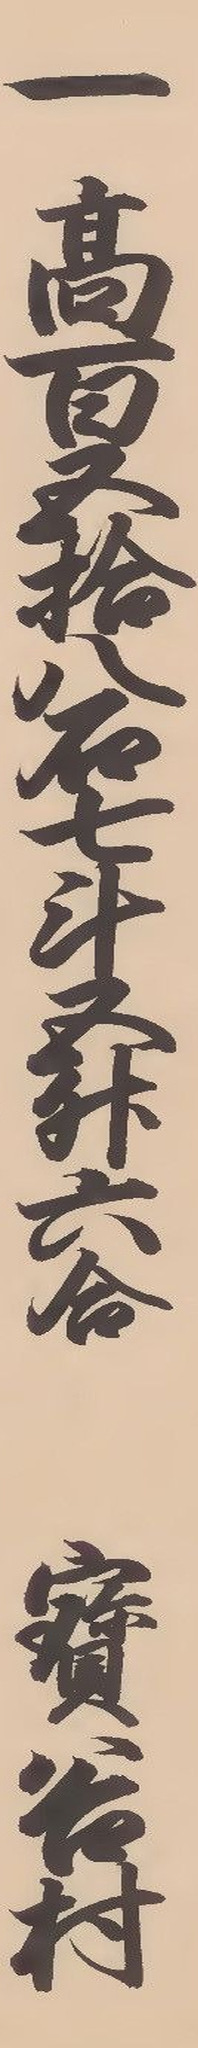一高百五拾八石七斗五升六合宝谷村
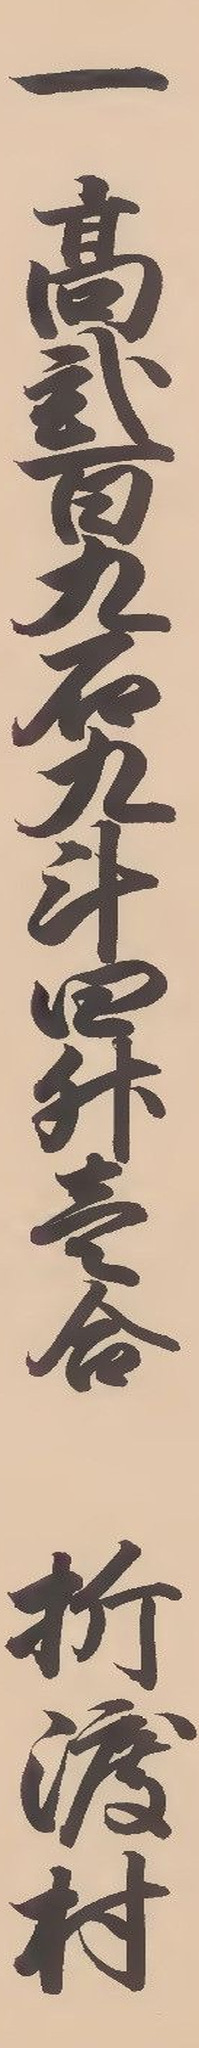一高弐百九石九斗四升壱合折渡村
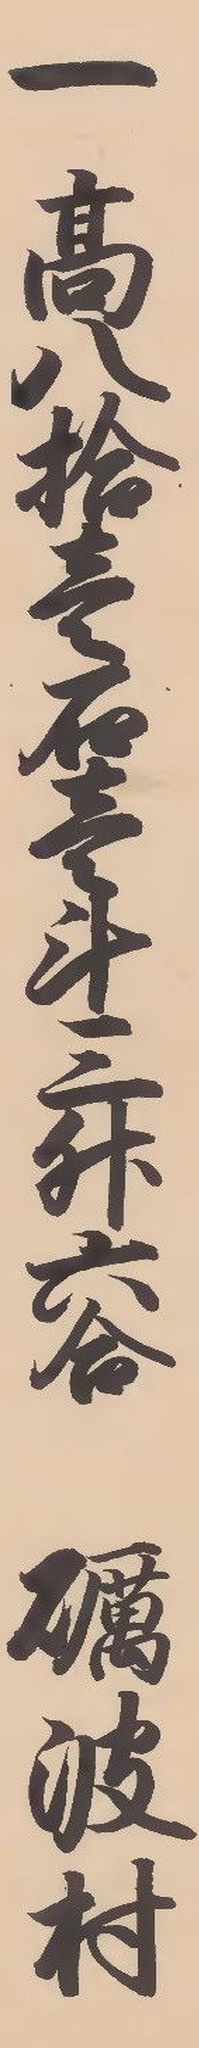一高八拾壱石壱斗三升六合礪波村
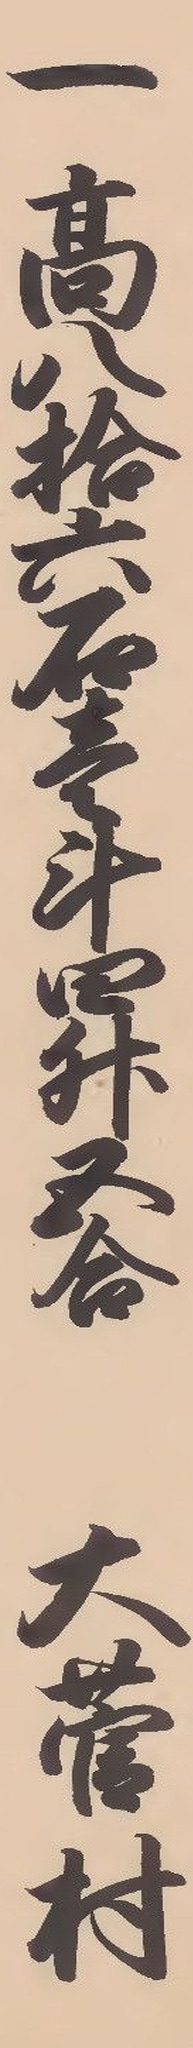一高八拾六石壱斗四升五合大菅村
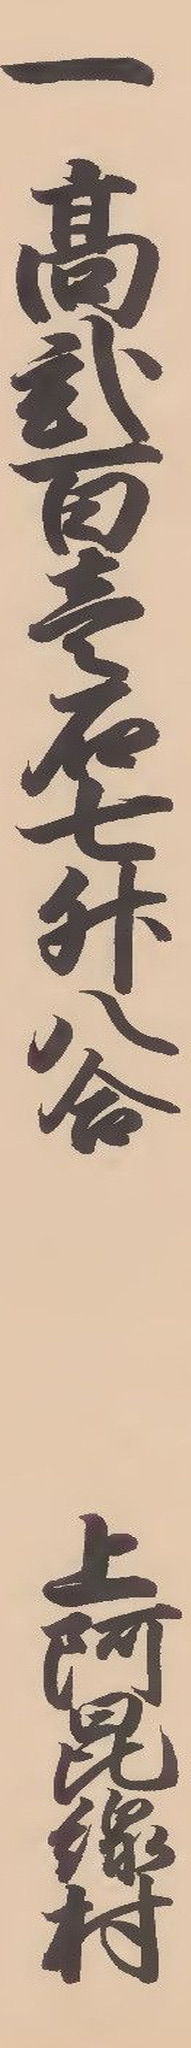一高弐百壱石七升八合上阿毘縁村
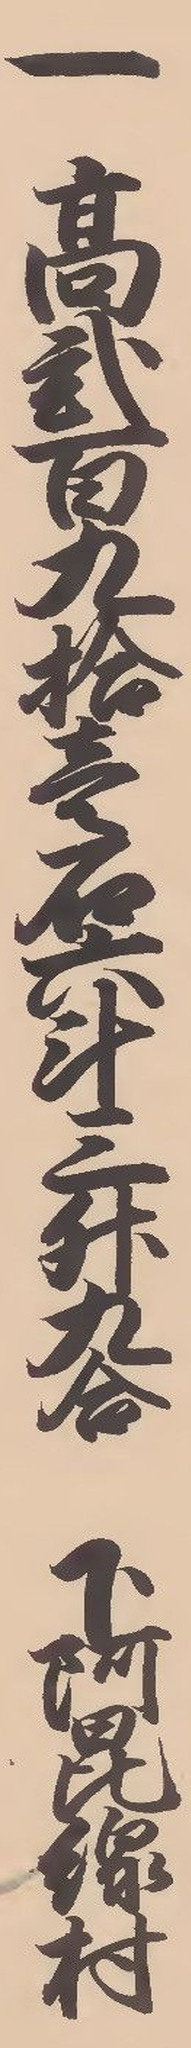一高弐百九拾壱石六斗三升九合下阿毘縁村

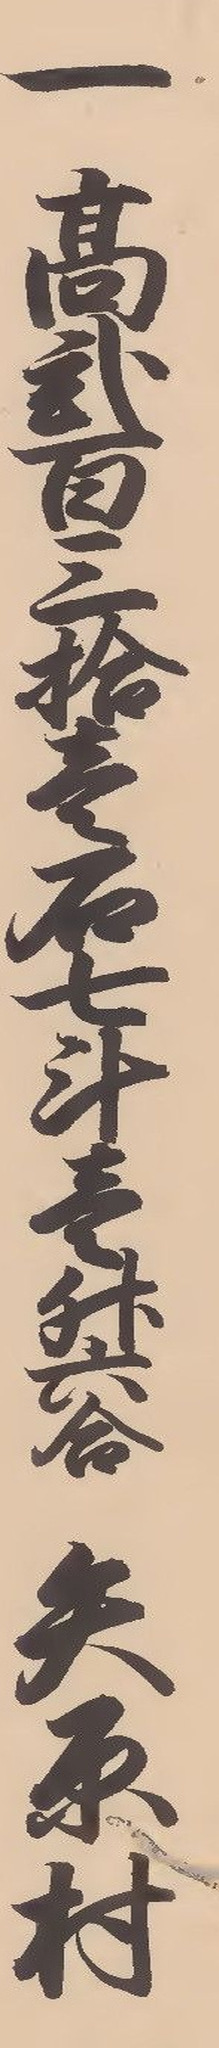一高弐百三拾壱石七斗壱升六合矢原村
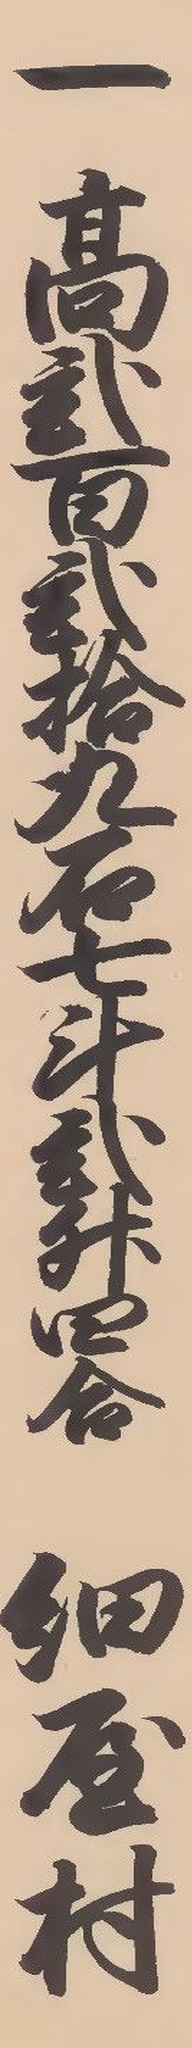一高弐百弐拾九石七斗弐升四合細屋村
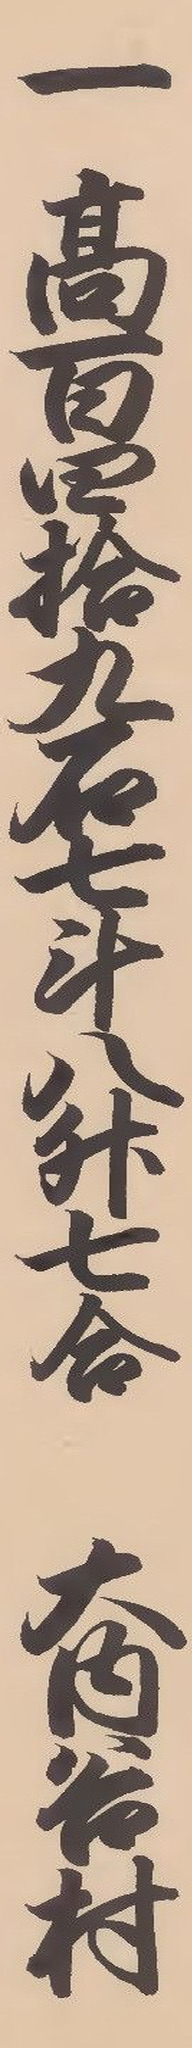一高百四拾九石七斗八升七合大内谷村
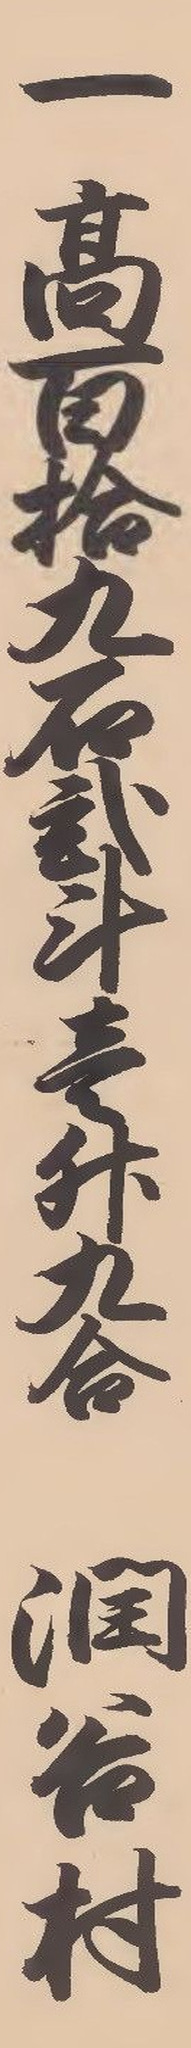一高百拾九石弐斗壱升九合潤谷村
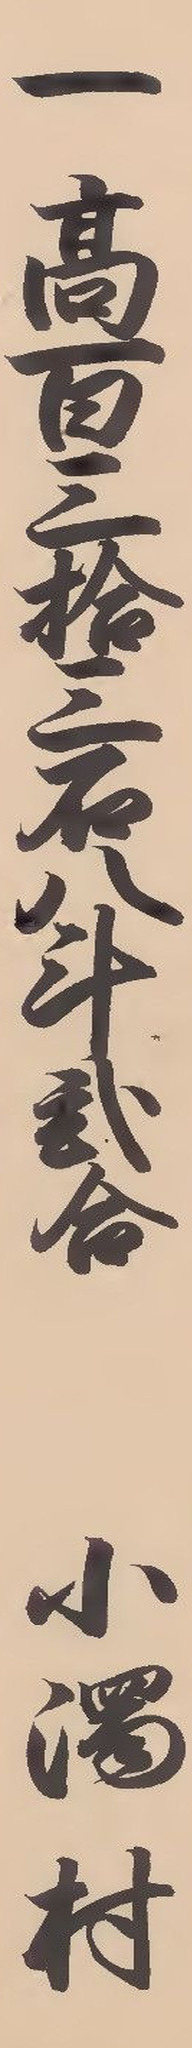一高百三拾三石八斗弐合小濁村
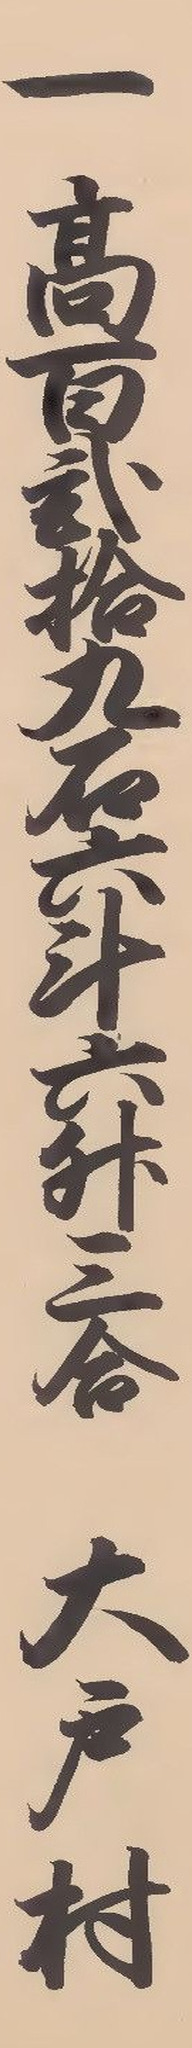一高百弐拾九石六斗六升三合大戸村
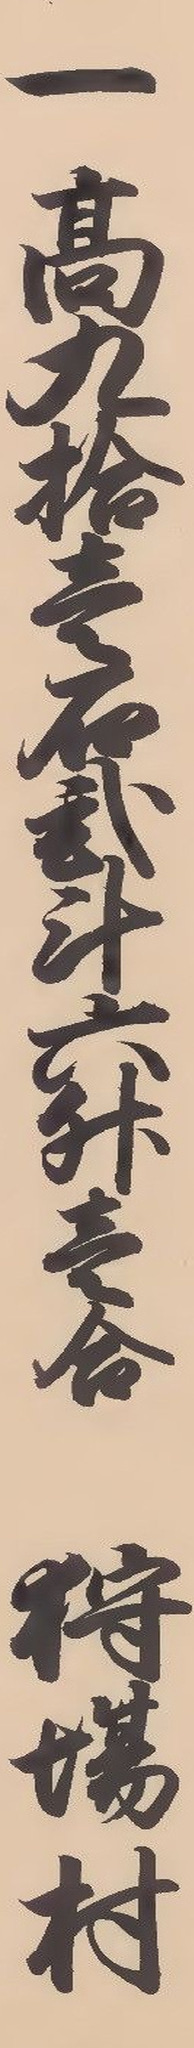一高九拾壱石弐斗六升壱合狩場村

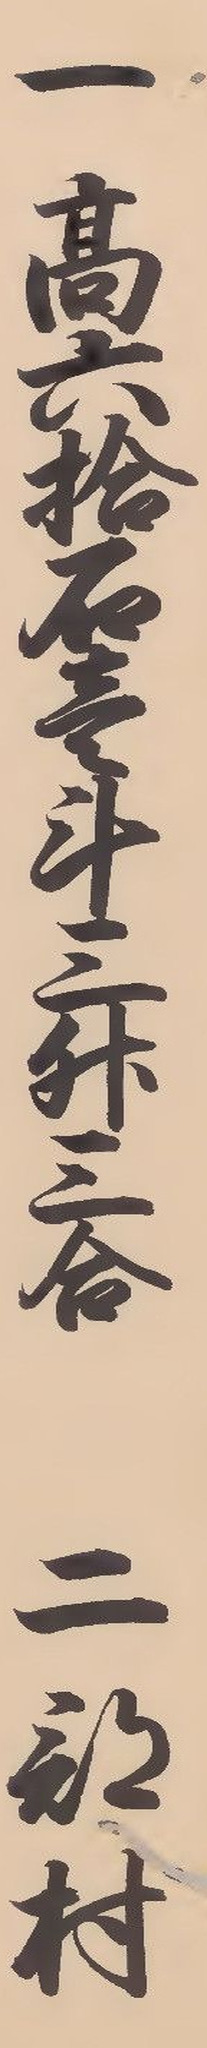一高六拾石壱斗三升三合二部村
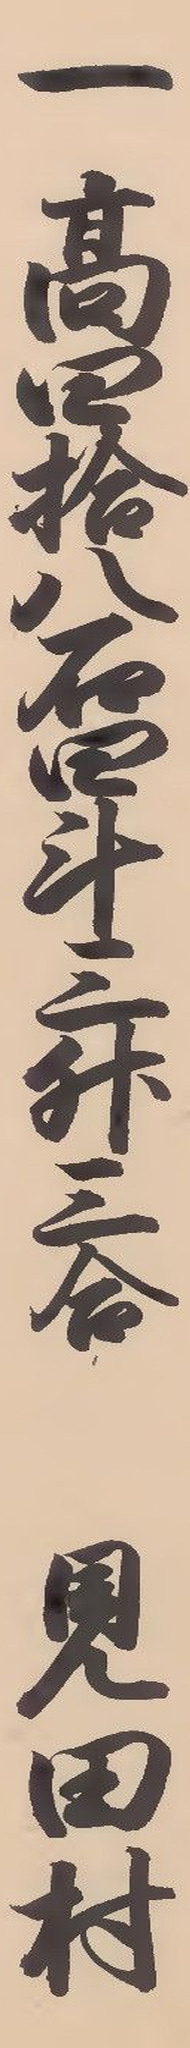一高四拾八石四斗三升三合見田村
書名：伯耆国郷帳
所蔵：国立公文書館 National Archives of Japan
